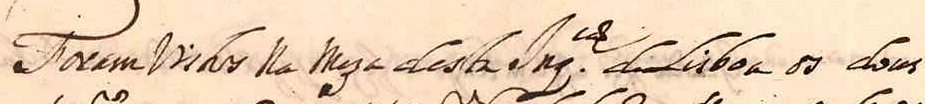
Foram Vistos na Meza desta Inq.çaõ de Lisboa os dous
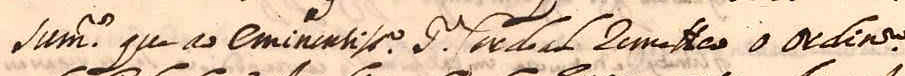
Sum.ros que ao Eminentiss.o s.or Cardeal Remetteo o Ordin.ro
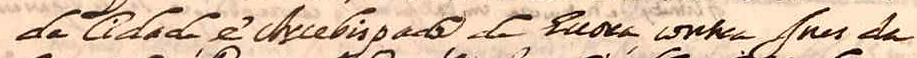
da Cidade e Arcebispado de Euora contra Jnes da
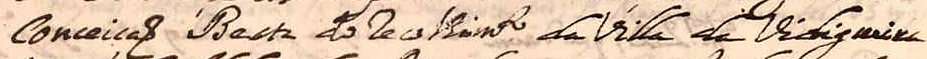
Conceiçaõ Beata do Recolhim.to da Villa da Vidigueira
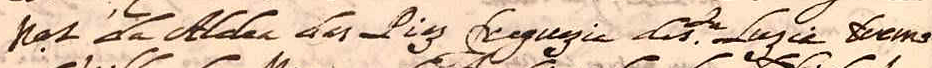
n.al da Aldea das Piaz freguezia de s.ta Luzia, termo
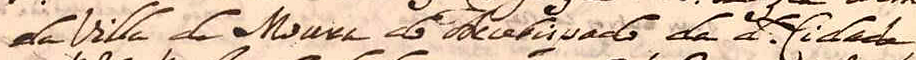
da Villa de Moura do Arcebispado da d̄.a Cidade
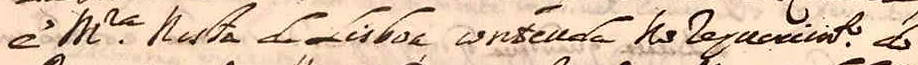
e M.ra nesta de Lisboa conteuda no Requerim.to do
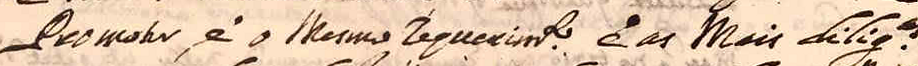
Promotor, e o mesmo Requerim.to, e as mais dilig.as
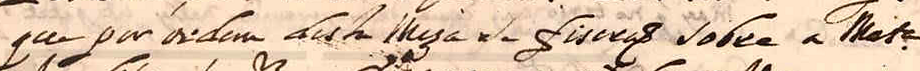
que por ordem desta Meza se fiseraõ sobre a mat.a
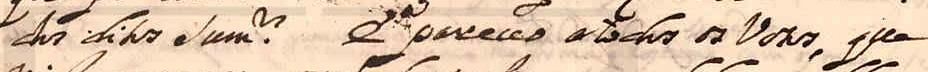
dos ditos Sum.os E pareceo a todos os Votos, que
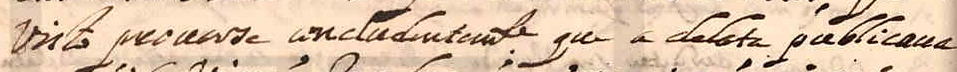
Visto prouarse concludentem.te que a delata publicaua
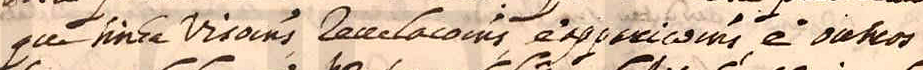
que tinha visoins, Reuelaçoins, e appariçoins, e outros
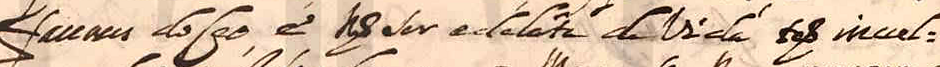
fauores do Ceo, e nā ser a delata de Vida, taõ incul
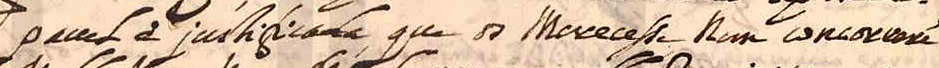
pauel, e justificada que os merecesse nem concorrerē
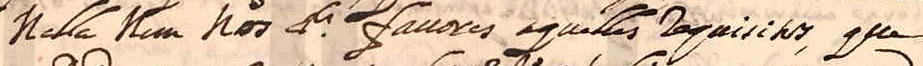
nella nem nos d.s fauores aquelles Requisitos, que
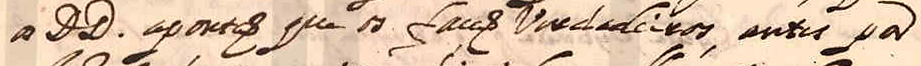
os DD. apontaõ que os façaõ verdadeiros, antes por
